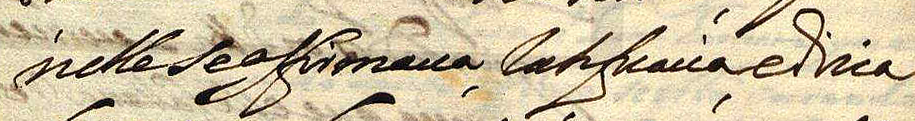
nelle se affirmaua, Ratificaua, e dizia
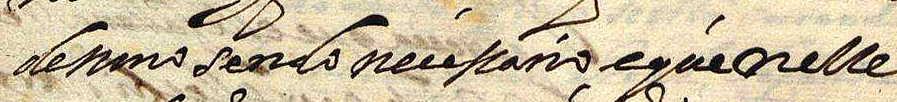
de nouo sendo necessario, e que nelle
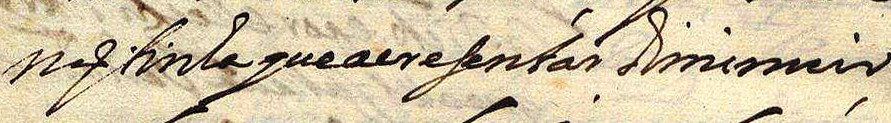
naõ tinha que acresentar, diminuir,
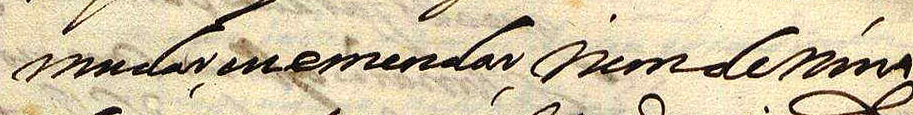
mudar, ou emendar, nem de nouo
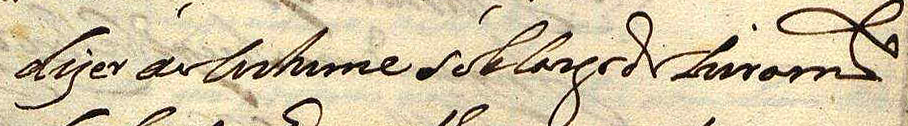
dizer ao custume sob Cargo do Iuramto
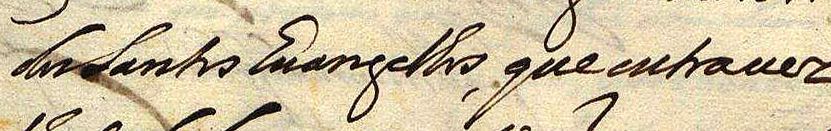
dos Santos Euangelhos, que outra uez
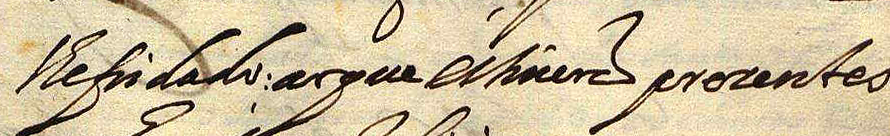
lhe foi dado: ao que estiueraõ prezentes
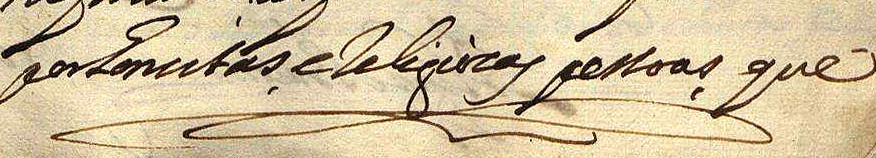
por honestas, e Religiozas pessoas, que
